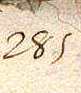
285
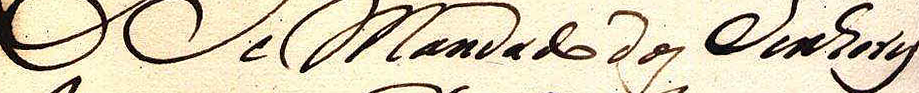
De Mandado dos Senhores
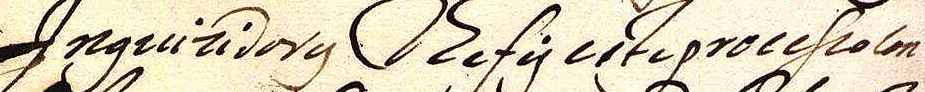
Jnquizidores lhe fis este processo con
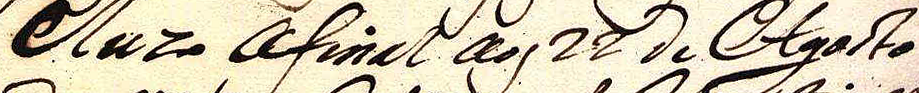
cluzo afinal aos 22 de Agosto
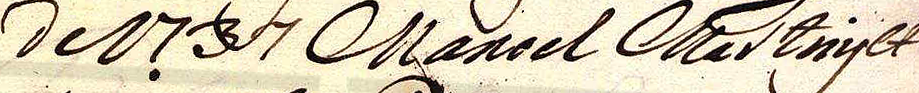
de 1737 Manoel Martins A
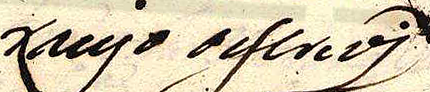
raujo o escrevj.
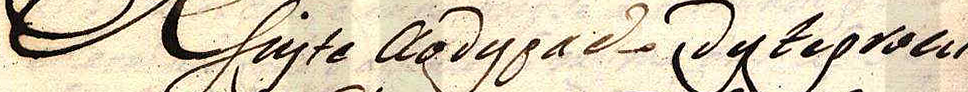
Assiste ao despacho deste proces
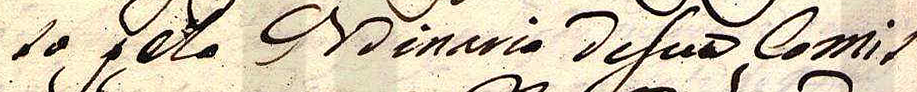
so pelo Ordinario de sua Comis
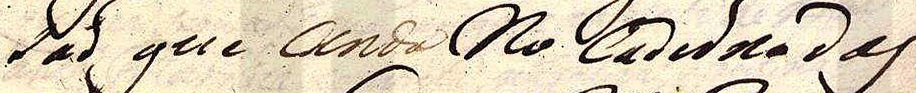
saõ que anda No Caderno das
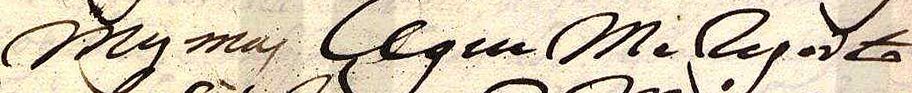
mesmas A que Me Reporto
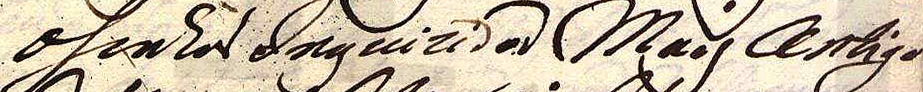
o senhor Inquizidor Mais Antigo
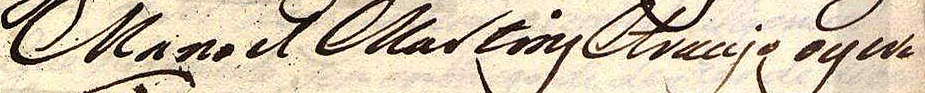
Manoel Martins Araujo o escre
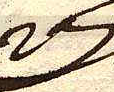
vj
